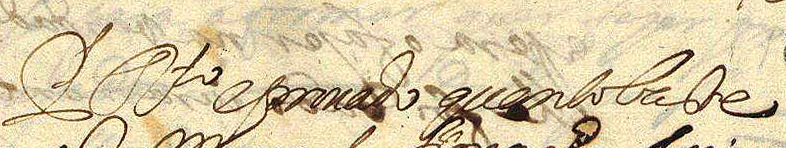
P Rto e prouado quanto baste
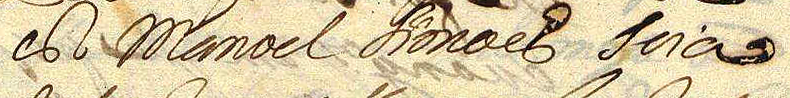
o R manoel Simoes seia
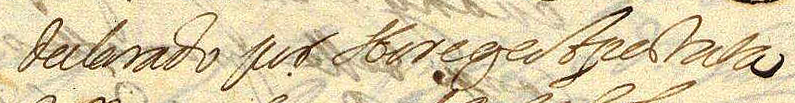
declarado por Herege Apostata
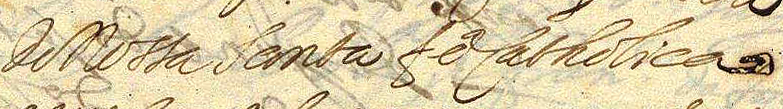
de nossa santa fé Catholica
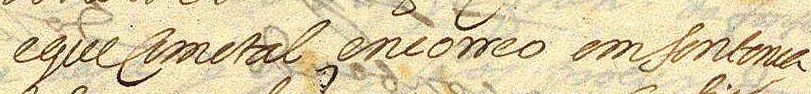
e que Como tal encorreo em sentença
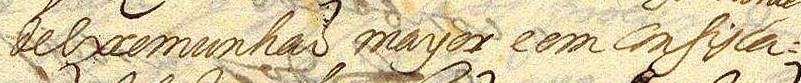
de excomunhaõ mayor e em confisca
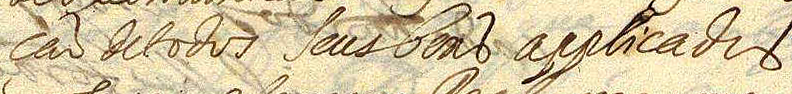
çaõ de todos seus bens applicados
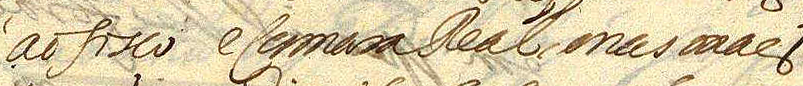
ao fisco e Camara Real, e nas maes
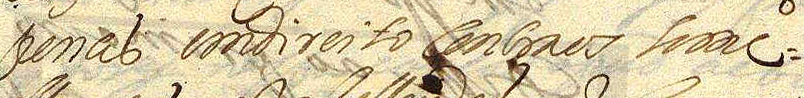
penas em direito contra os seme
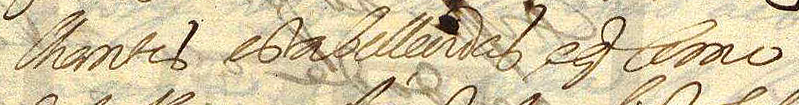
lhantes estabellecidas, e q̄ Como
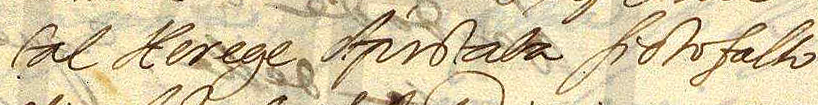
tal Herege Apostata ficto falso
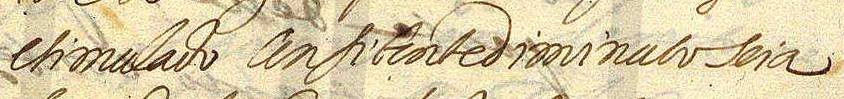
e simulado confitente diminuto seia
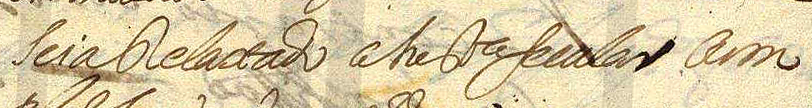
seia Relaxado a Iusta secular com
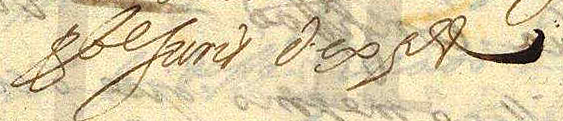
ꝓbo Juris et exps̄
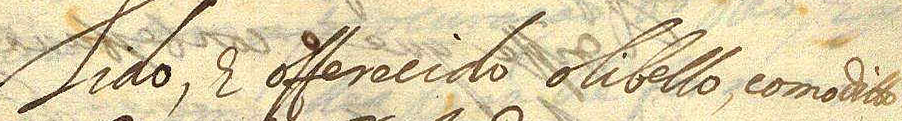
Lido, E offerecido o libello, como ditto
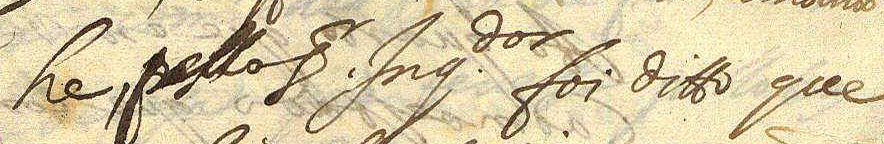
he, pello sr. Jnq.dor foi ditto que
